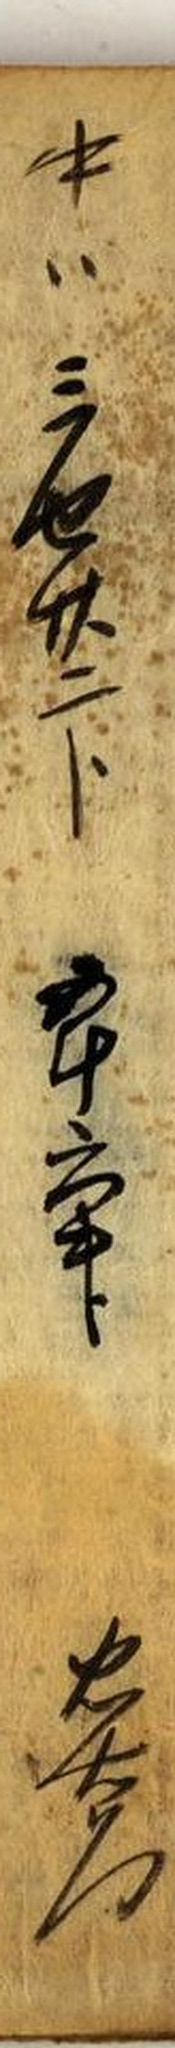中同三セ廿二分五斗六升忠右衛門
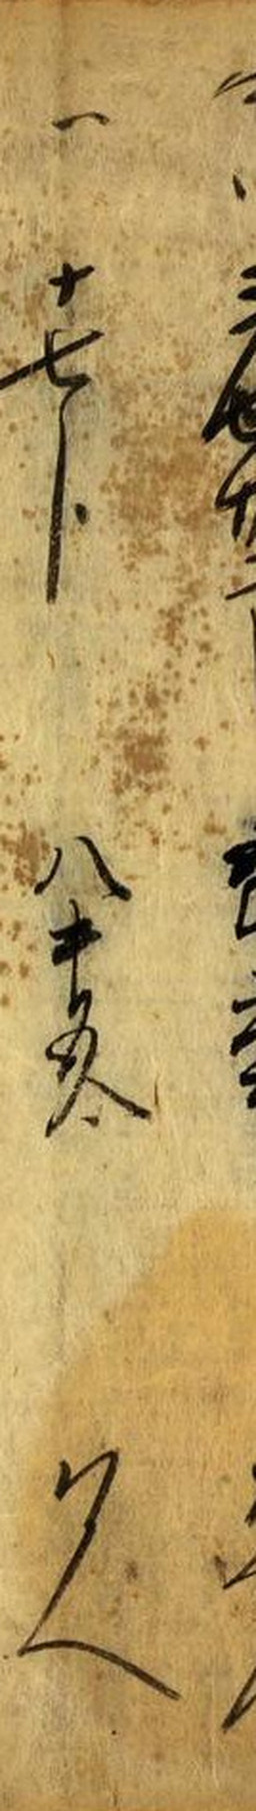同十七分八升五合同人
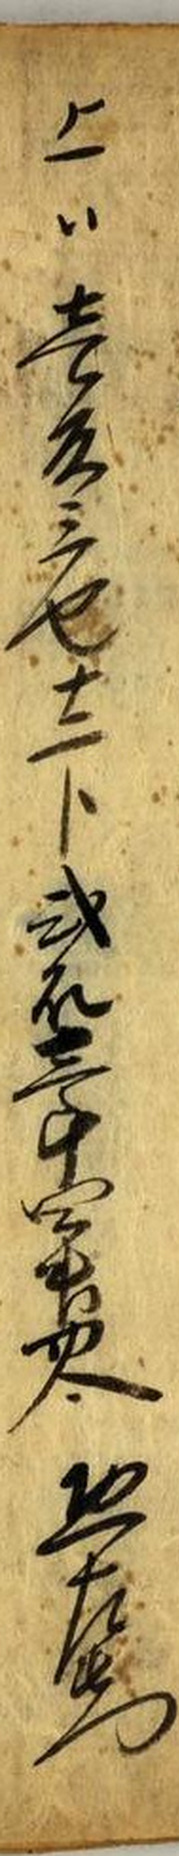上同壱反三セ十二分弐石壱斗四升四合惣左衛門
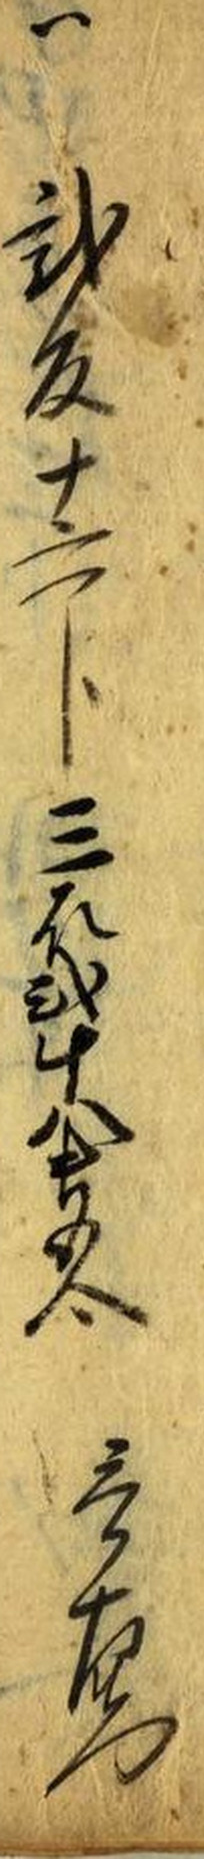同弐反十六分三石弐斗八升五合三郎左衛門
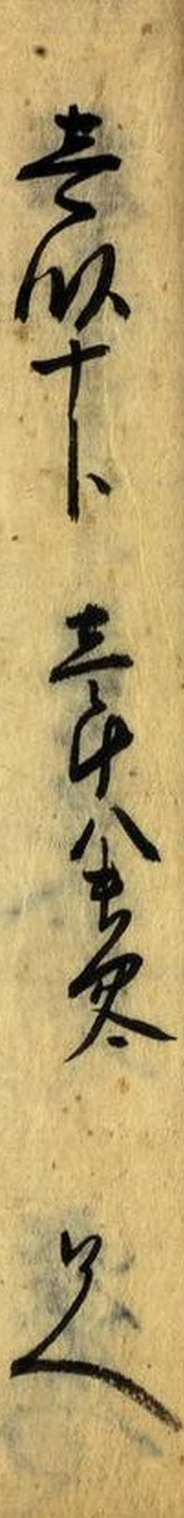同壱畝十分壱斗八升四合同人
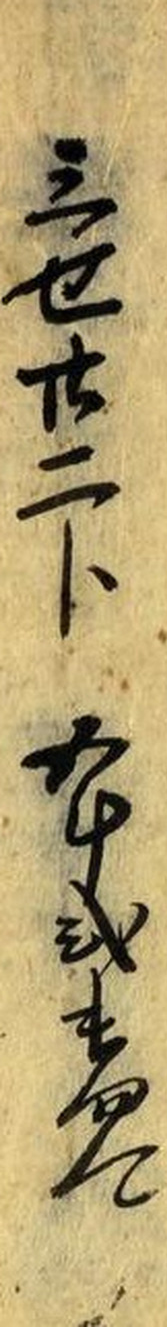同三セ廿二分五斗弐升四合同人
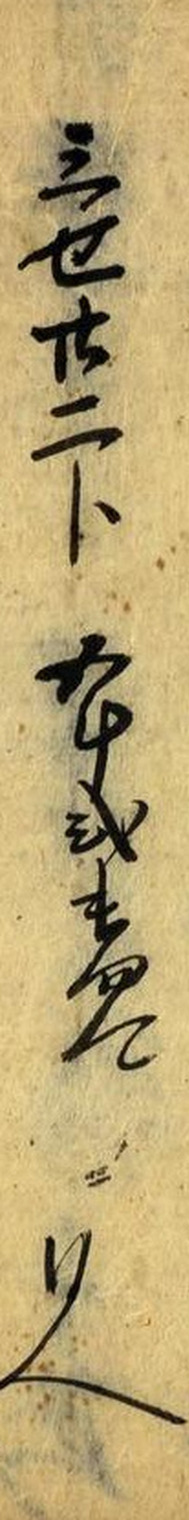同三セ廿二分五斗弐升四合同人
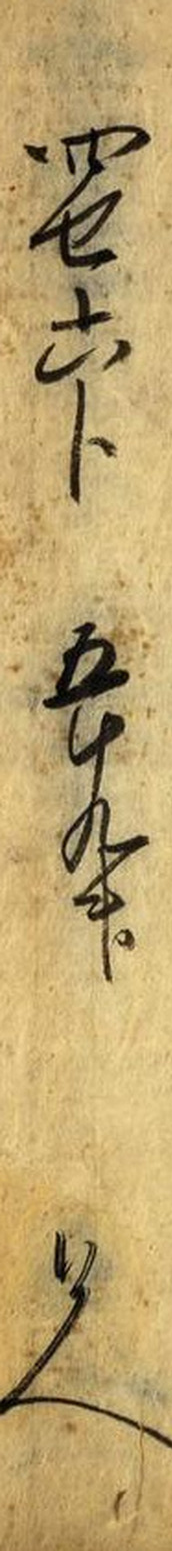同四セ六分五斗九升同人
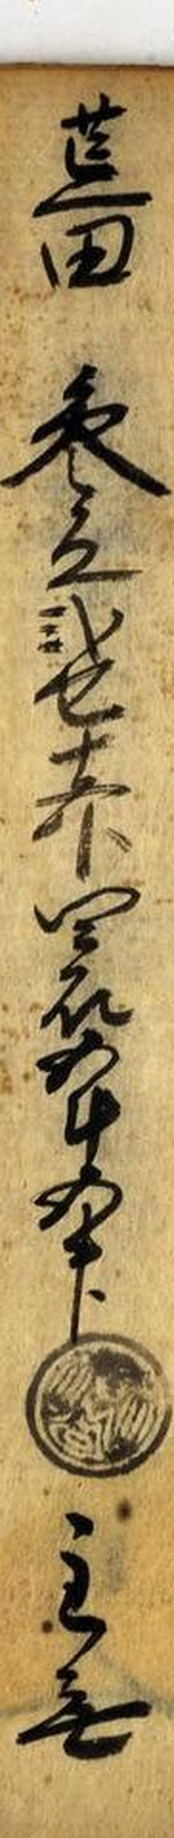荒田参反弐セ十五分四石五斗五升㊞主無
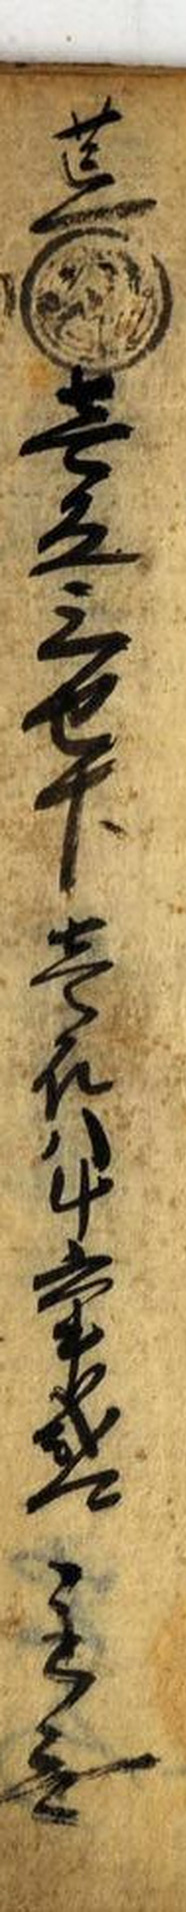荒同㊞壱反三セ一分壱石八斗六升弐合主無
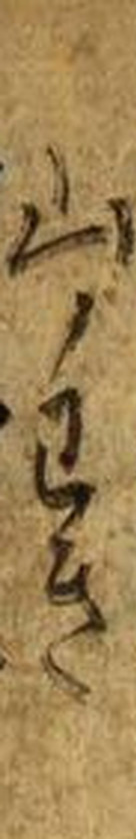山ノわき
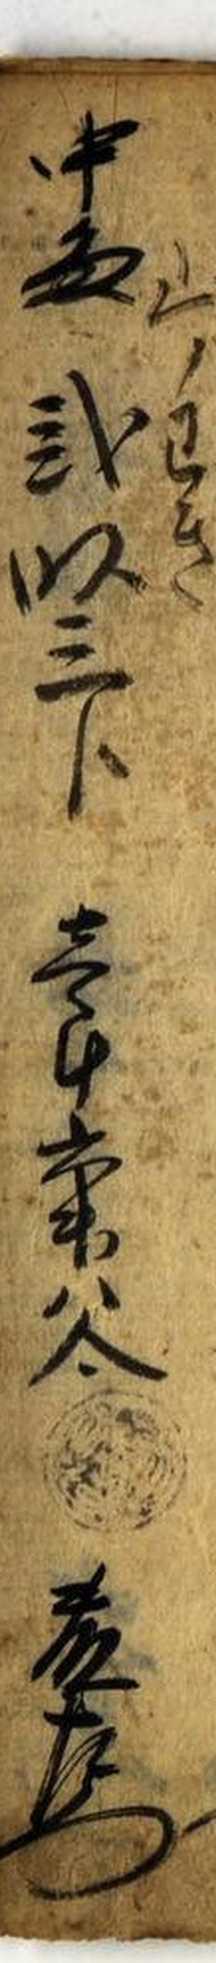中畠弐畝三分壱斗六升八合藤左衛門

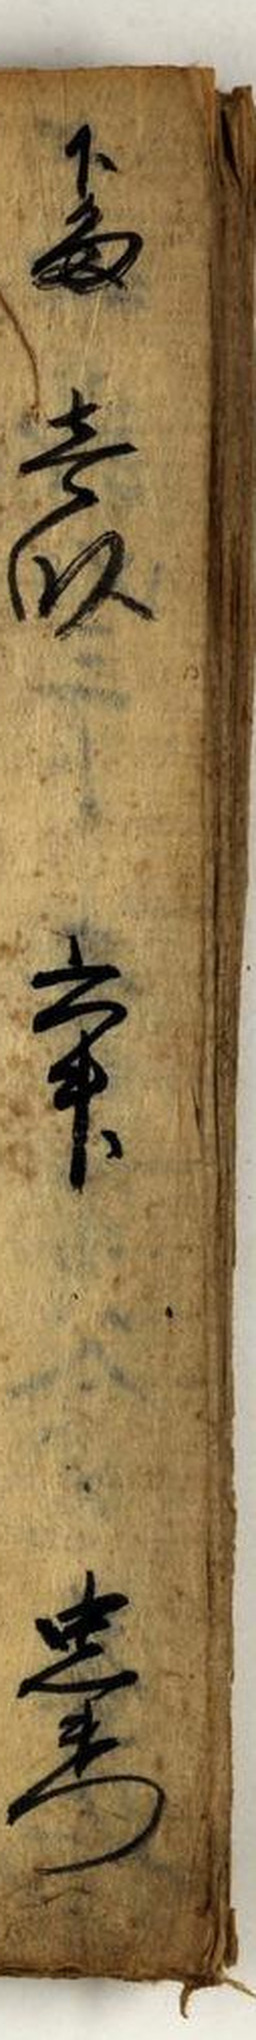下畠壱畝六升忠右衛門
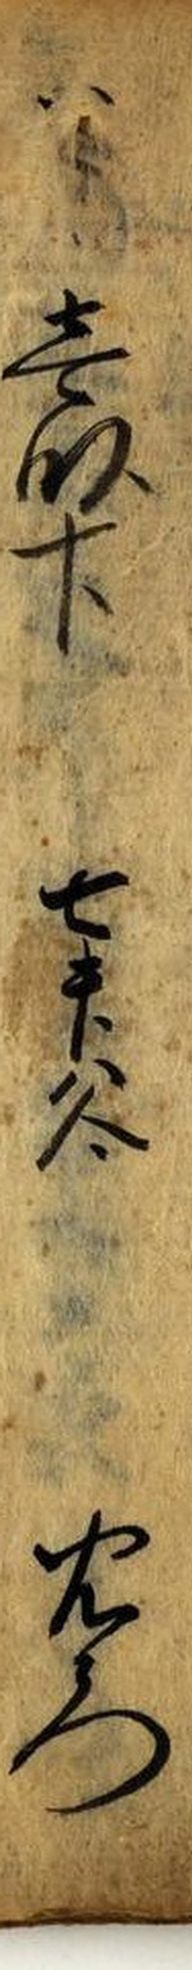同壱畝一分七升八合忠右衛門
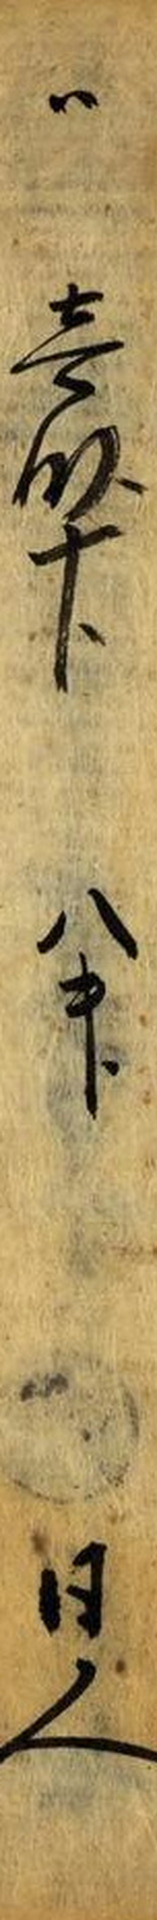同壱畝一分八升同人
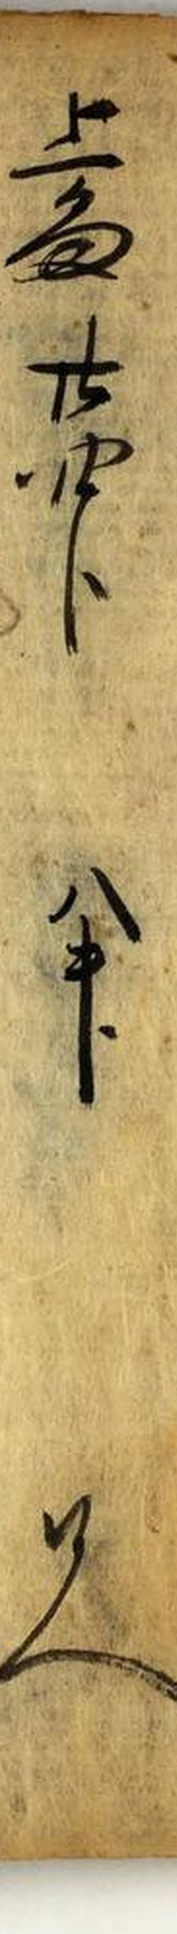上畠廿四分八升同人
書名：越前国西方内志津庄内本折村御検地帳
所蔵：福井県文書館 Fukui Prefectural Archives
